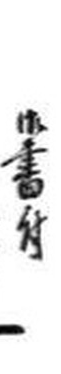御書付
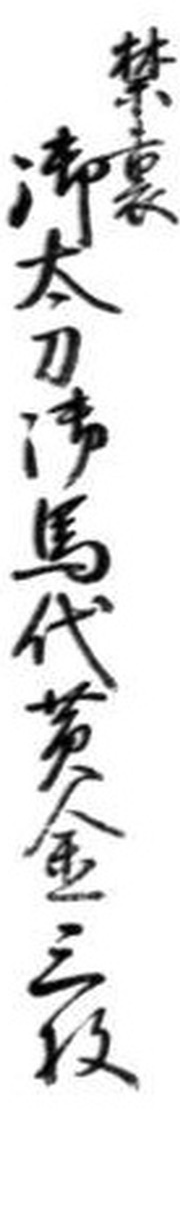御太刀御馬代黄金三枚
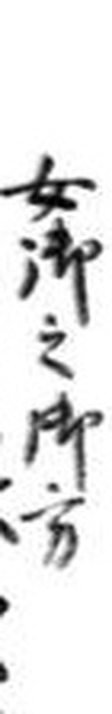女御之御方
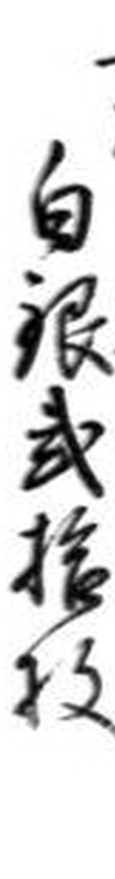白銀弐拾枚
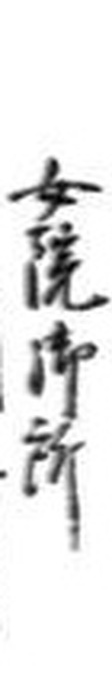女御御所
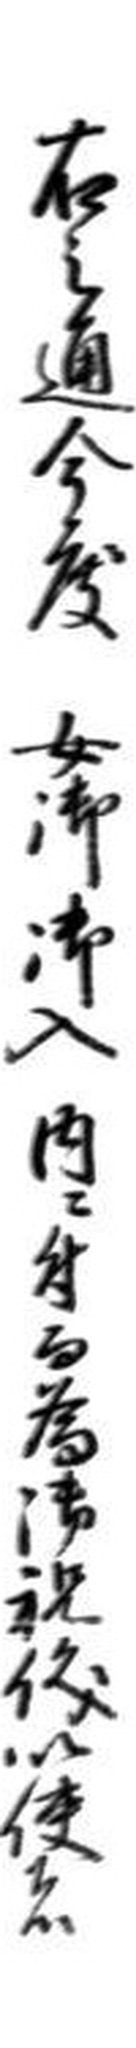右之通今度女御御入内ニ付而為御祝儀以使者
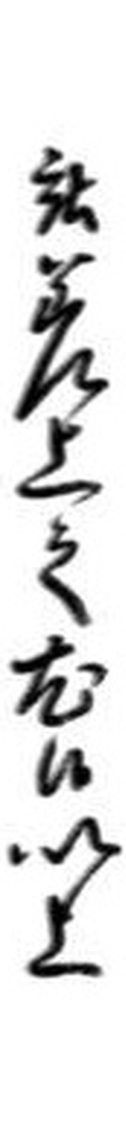被差上之尤候以上
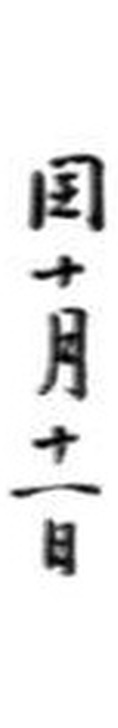閏十月十一日
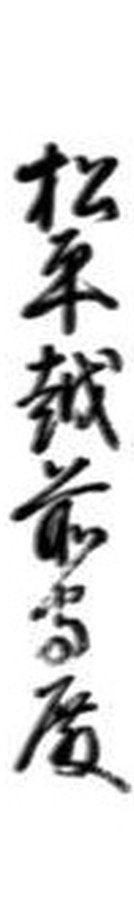松平越前守殿
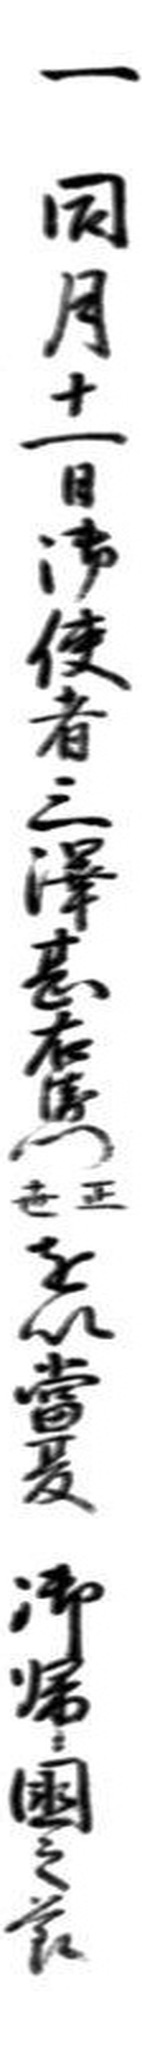一同月十一日御使者三沢甚右衛門正世を以当夏御帰国之節
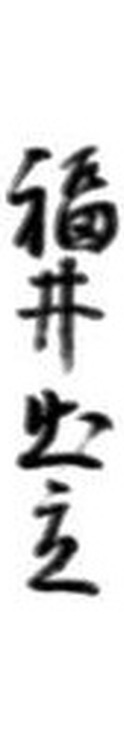福井出立
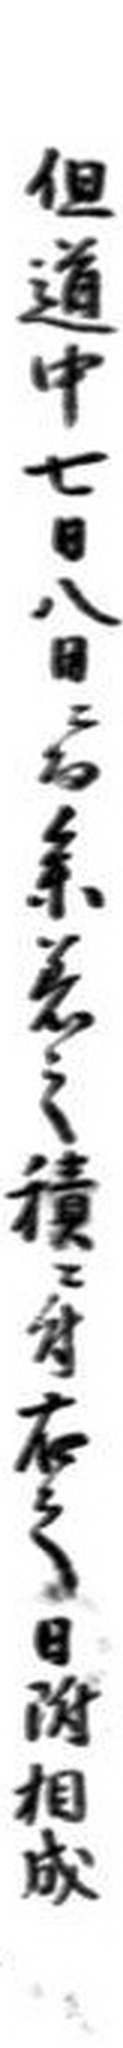但道中七日八日ニ而参着之積ニ付右之日附相成

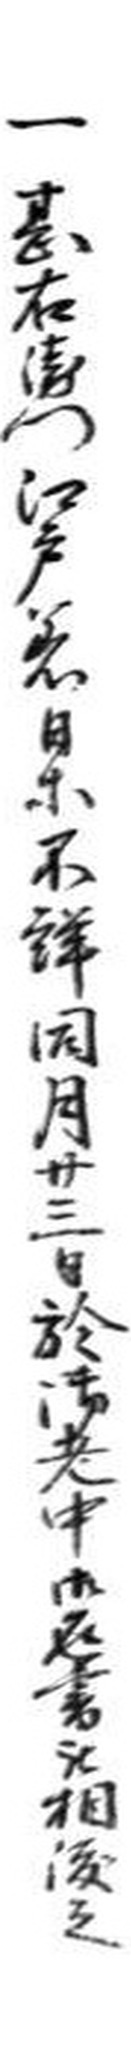一甚右衛門江戸着日等不詳同月廿三日於御老中御返書被相渡之
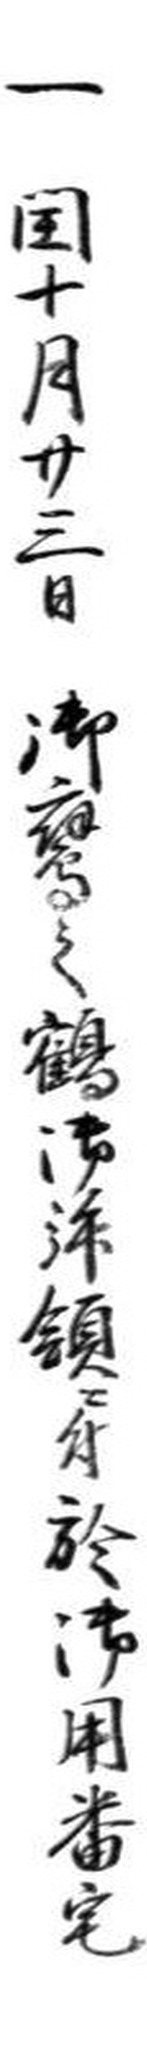一閏十月廿三日御鷹之鶴御拝領ニ付於御用番宅
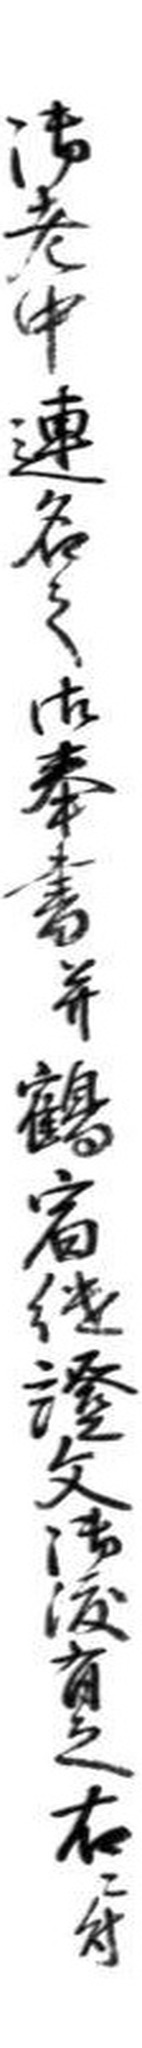御老中連名之御奉書幷鶴宿継証文御渡有之右ニ付
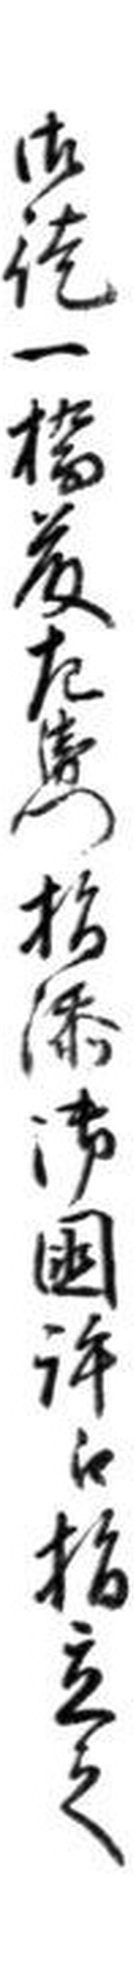御徒一橋藤左衛門指添御国許江指立之
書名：家譜 七 光通公 従寛文四年到同九年
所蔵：福井県文書館 Fukui Prefectural Archives
